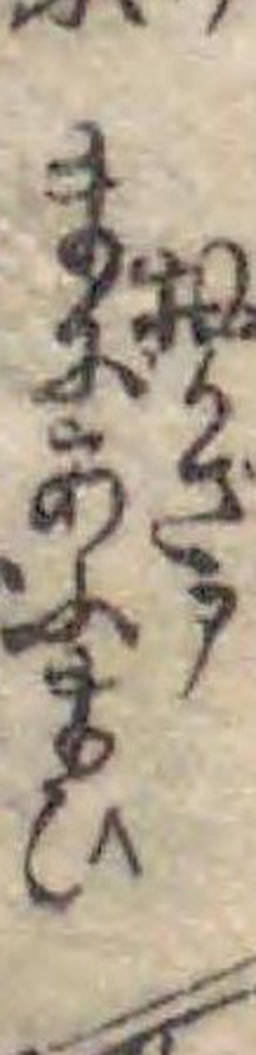まにあふまひ
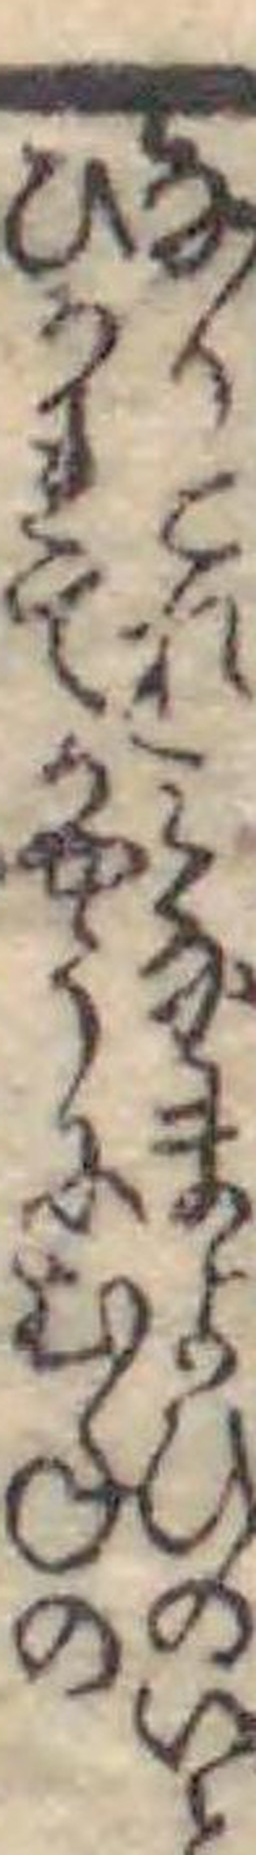ひかれてかやうにむねの
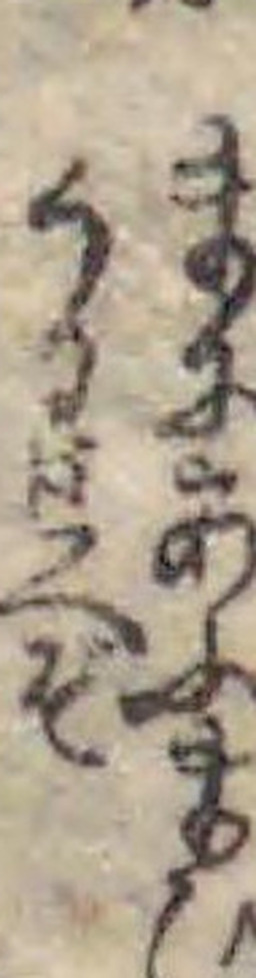うるせへぞ
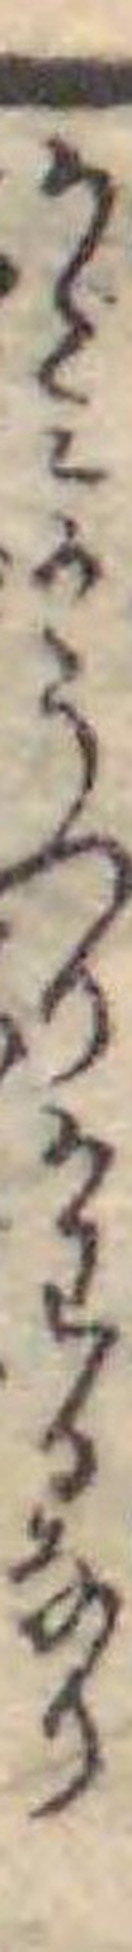かゝみかうつりかわるなり
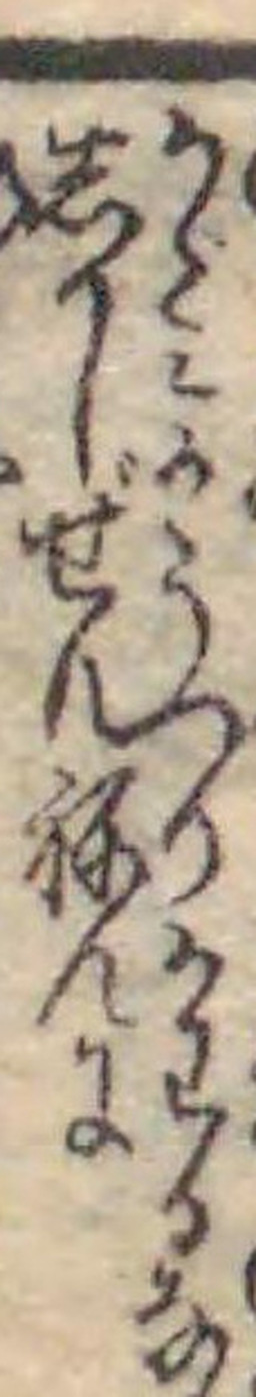しかしぜんねんに
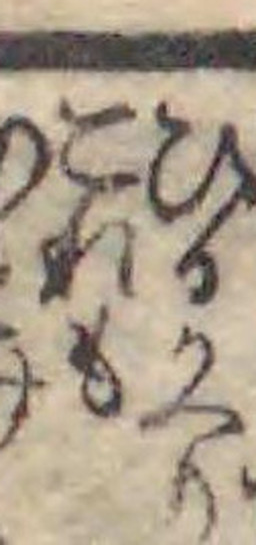これも
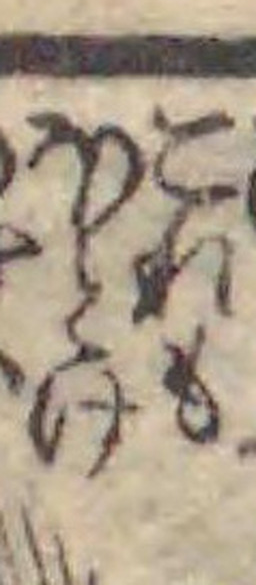ほとけ
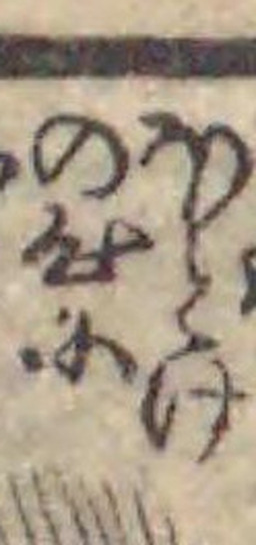の心に
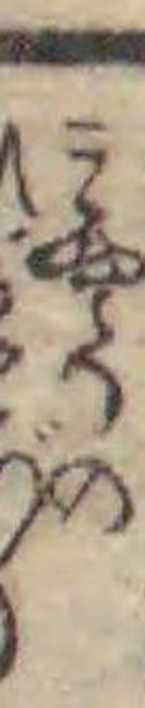みやうの
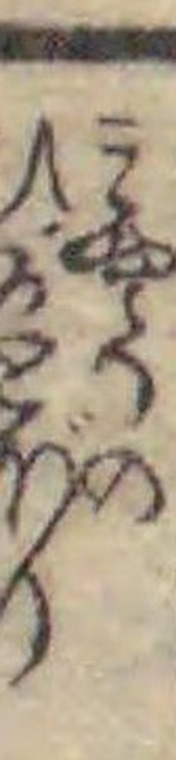ひかとぼり
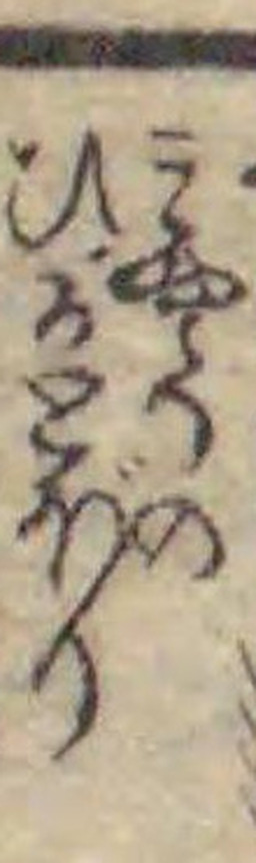ひかとぼり
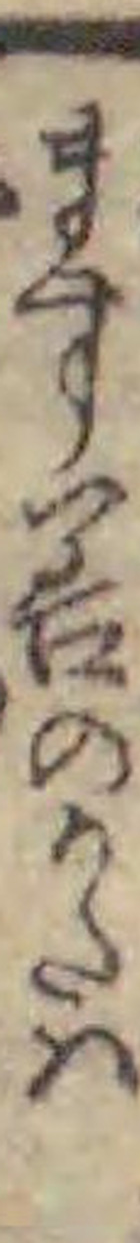ます善のかたは
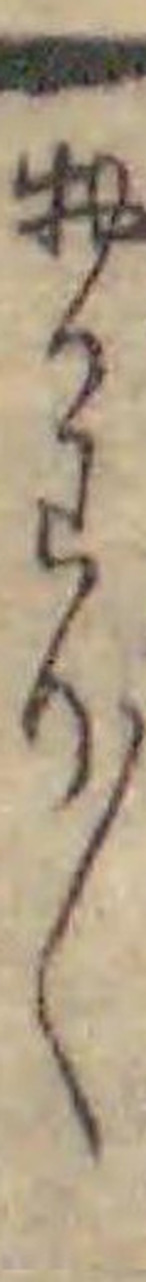おかわり〳〵

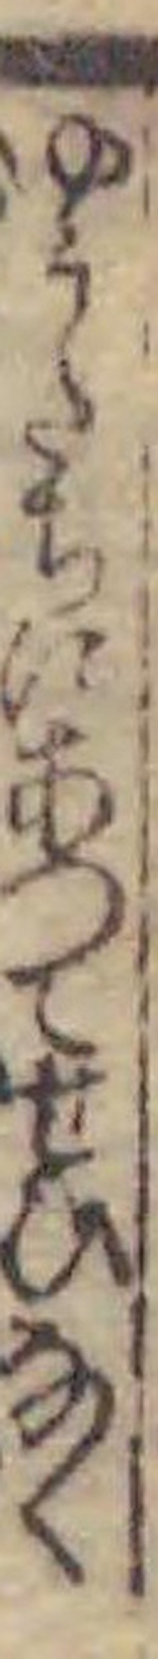ゆうたちにあつてせひなく
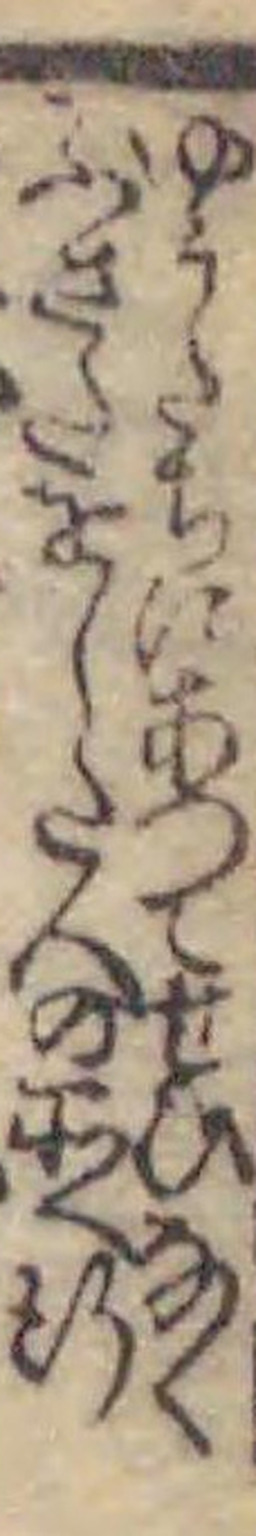ぶさたをした人の所へ行
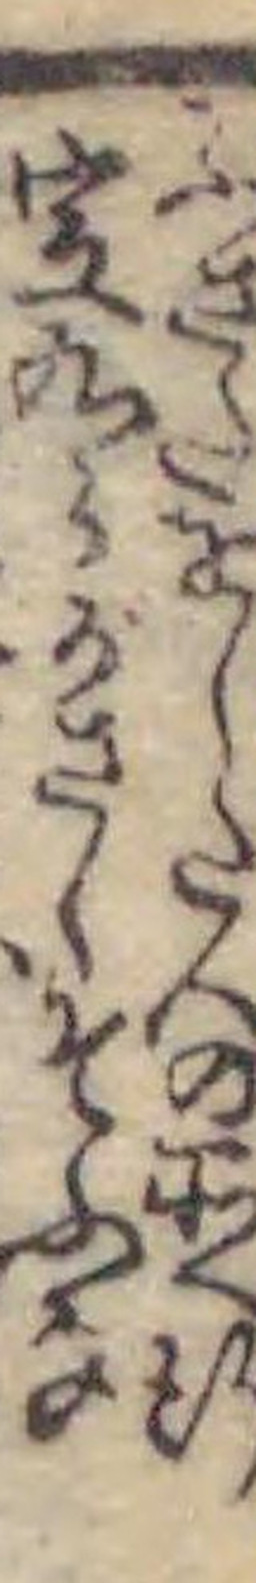定九郎がさしそふな
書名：人心鏡写絵 : 3巻
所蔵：国立国会図書館 National Diet Library, JAPAN
